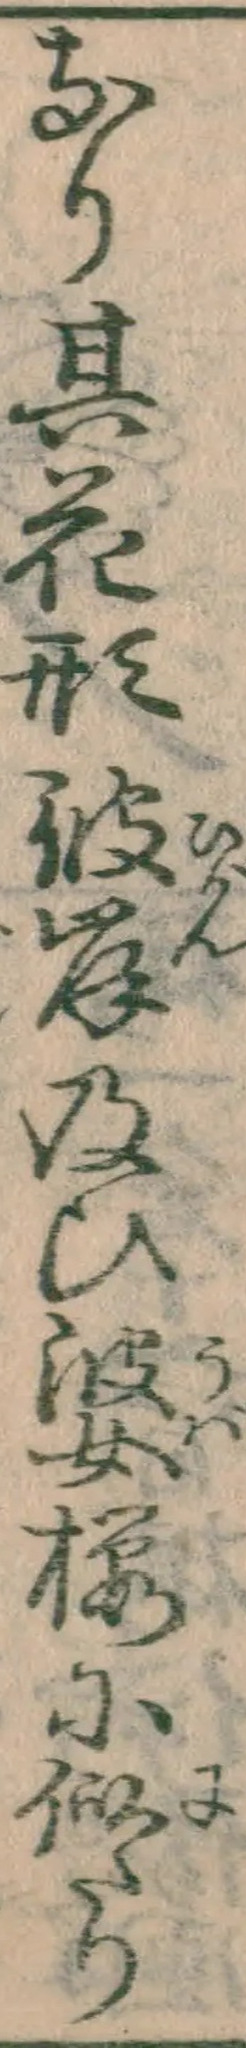なり其花形彼岸及ひ婆桜に似たり
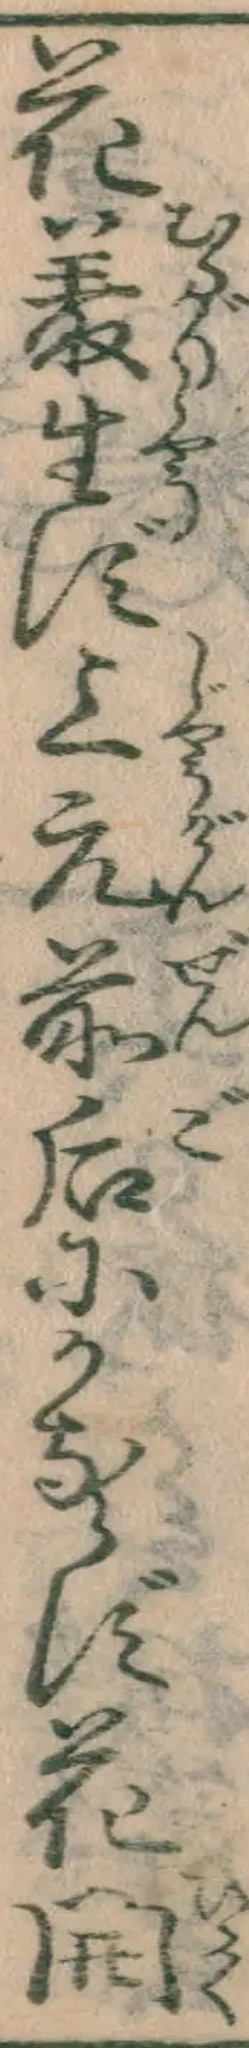花叢生ず上元前后にかならず花開
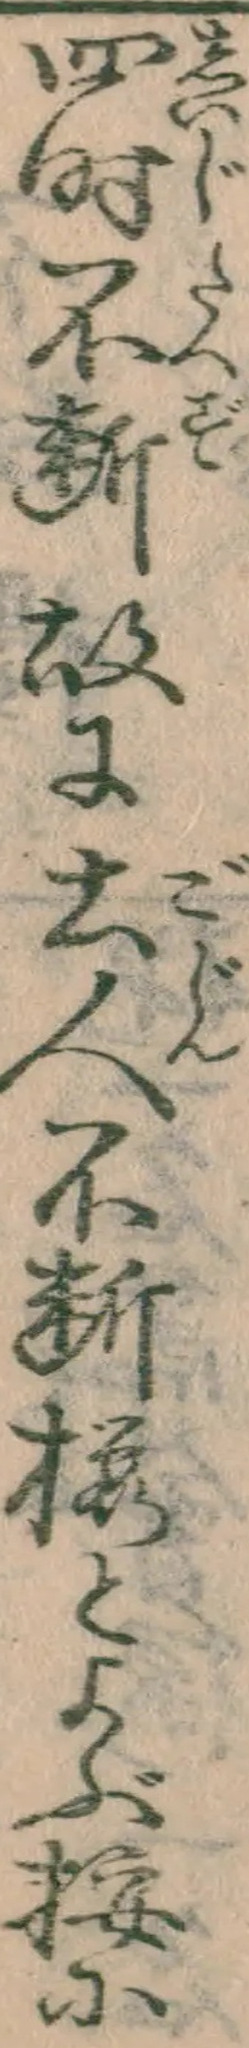四時不断故に土人不断桜とよぶ按に
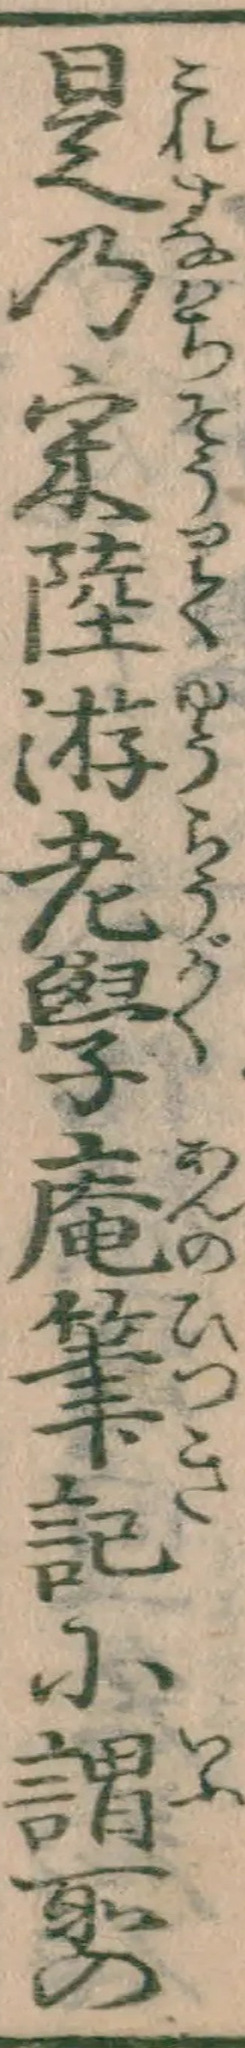是乃宗陸游老学庵筆記に謂所の
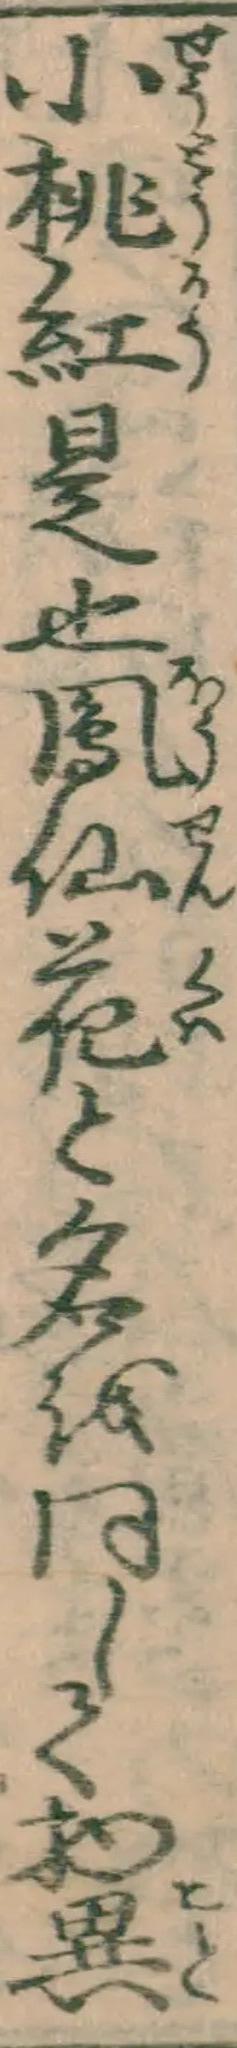小桃紅是也鳳仙花と名を同して物異
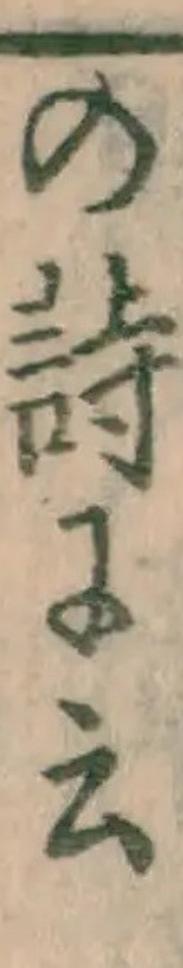の詩に云
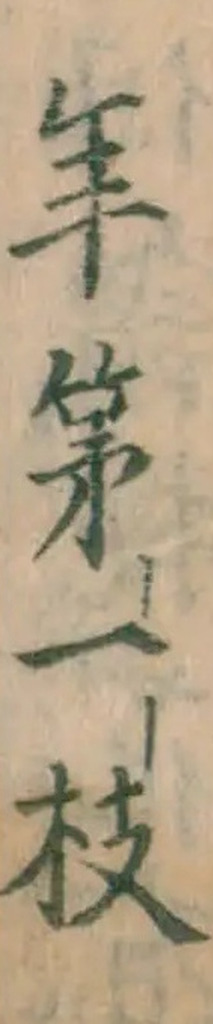年第-一-枝

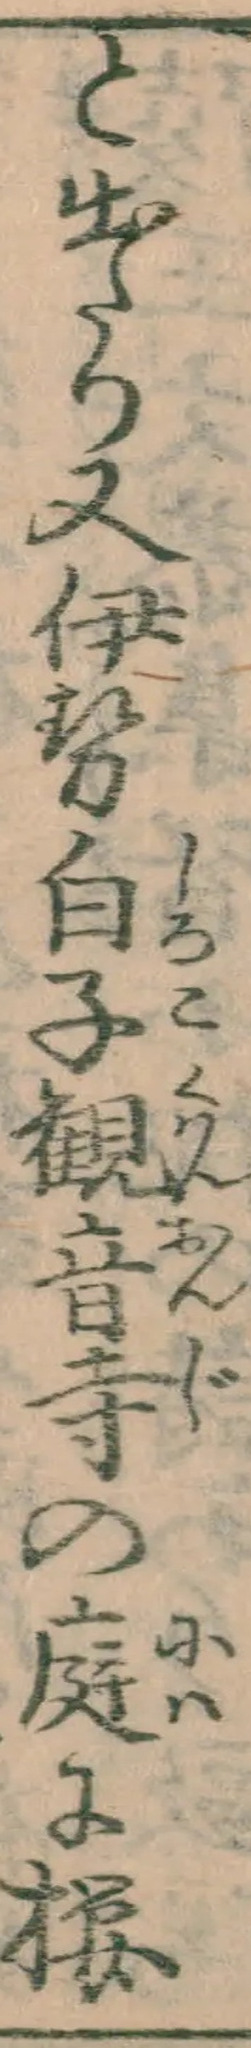と出たり又伊勢白子観音寺の庭に桜
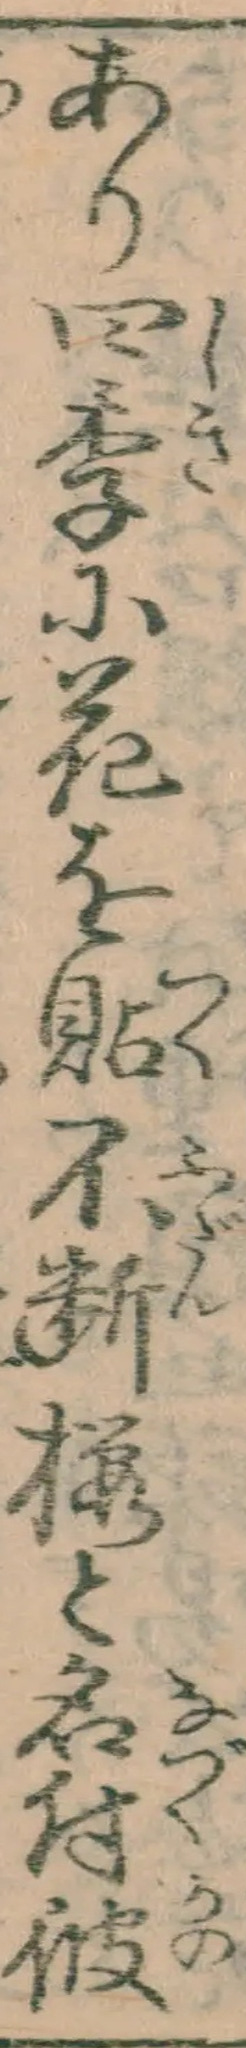あり四季に花を貼不断桜と名付彼
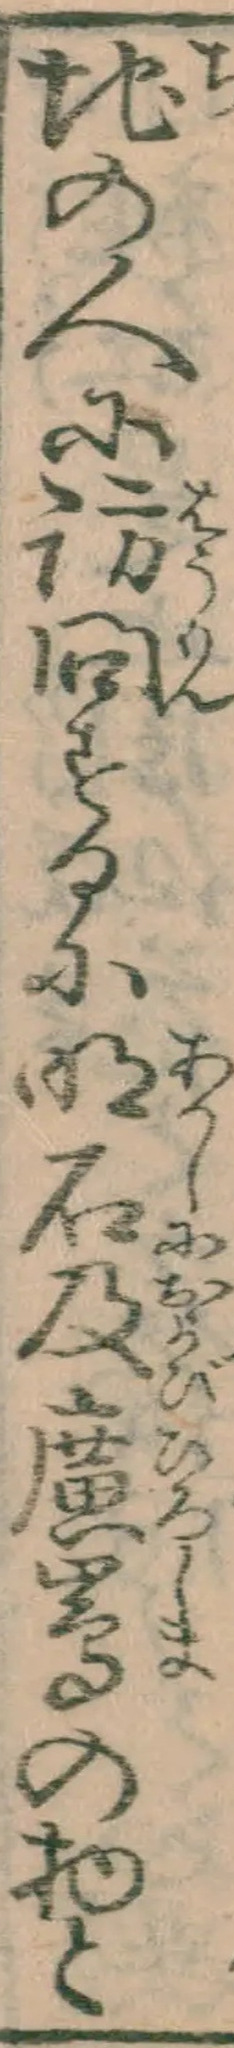地の人に訪問するに明石及広島の物と
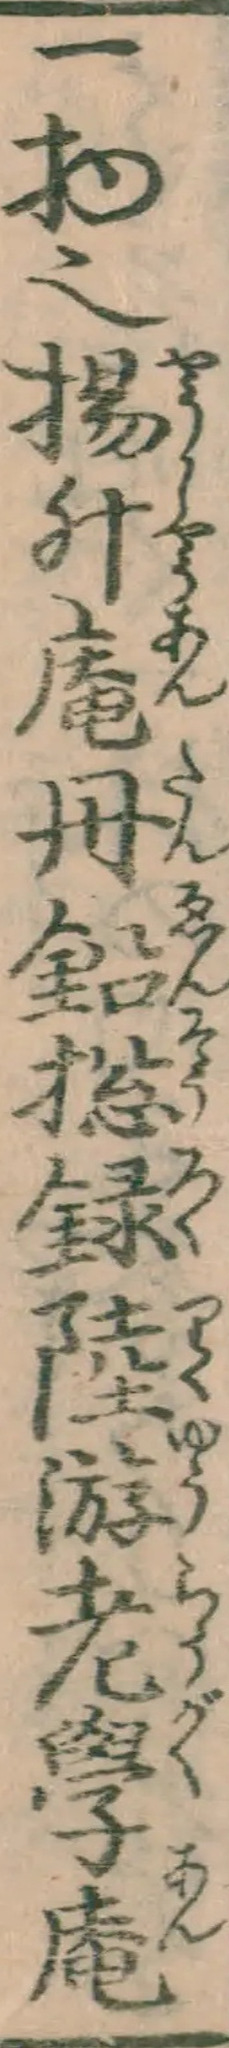一物也楊升庵丹鉛総録陸游老学庵
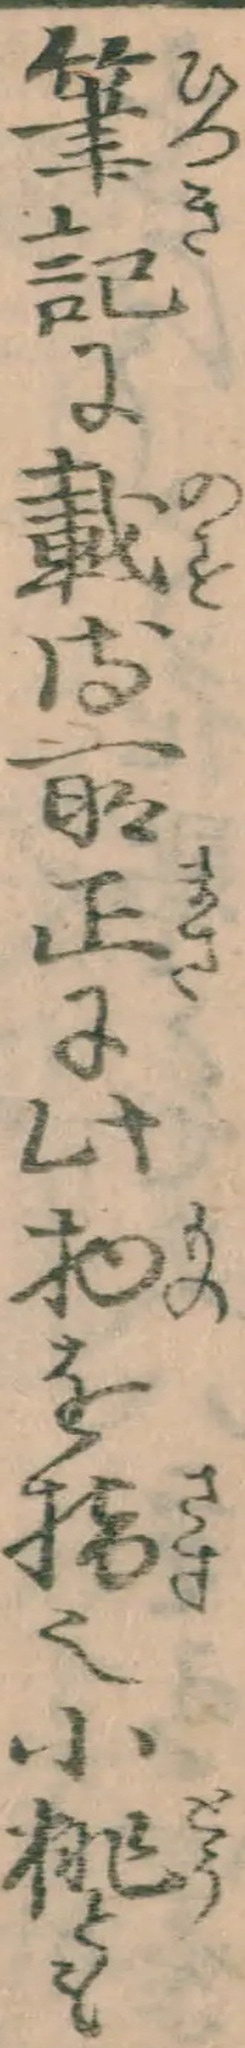筆記に載る所正に此物を指也小桃とも
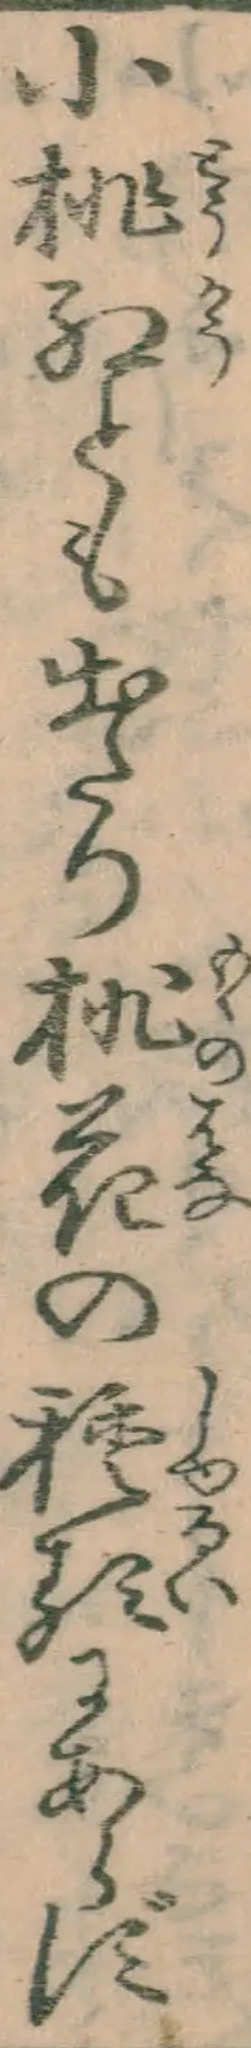小桃紅とも出たり桃花の種類にあらず
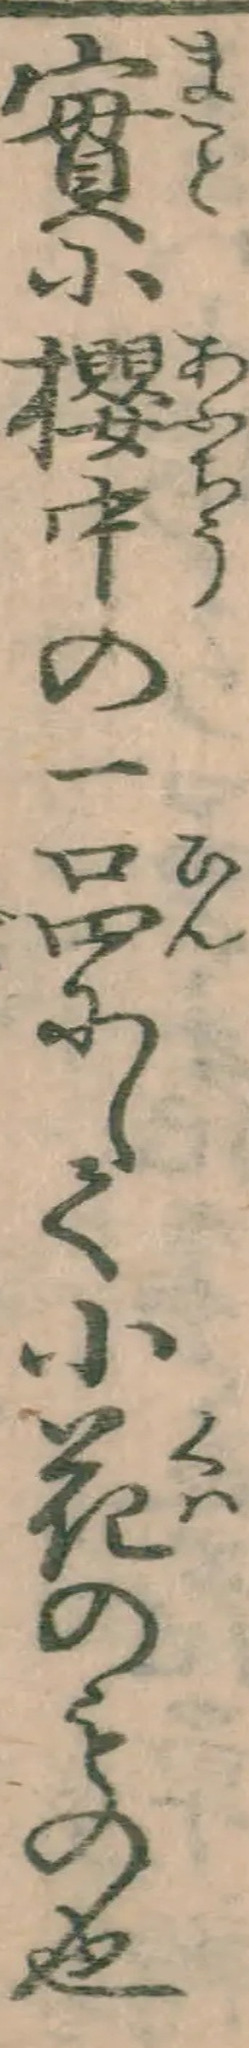実に桜中の一品にして小花のもの也
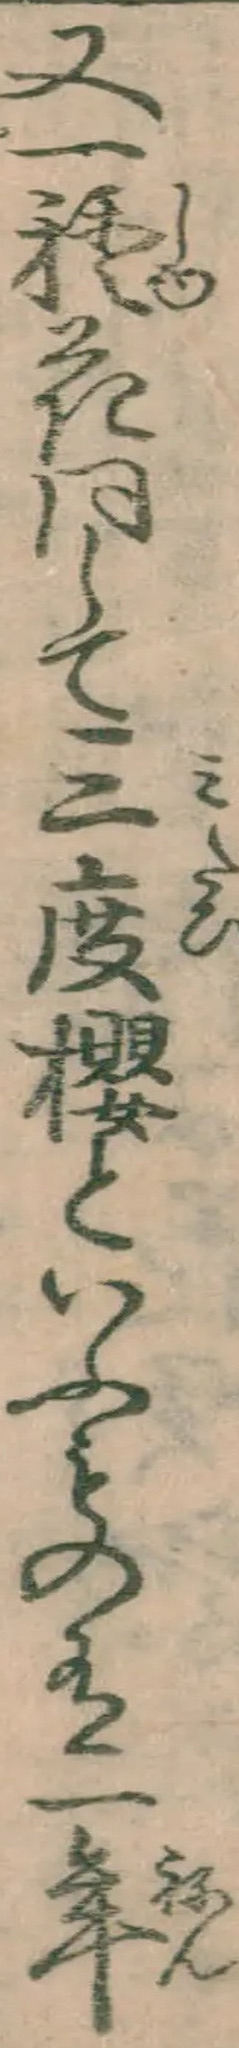又一種花同して三度桜といふもの有一年
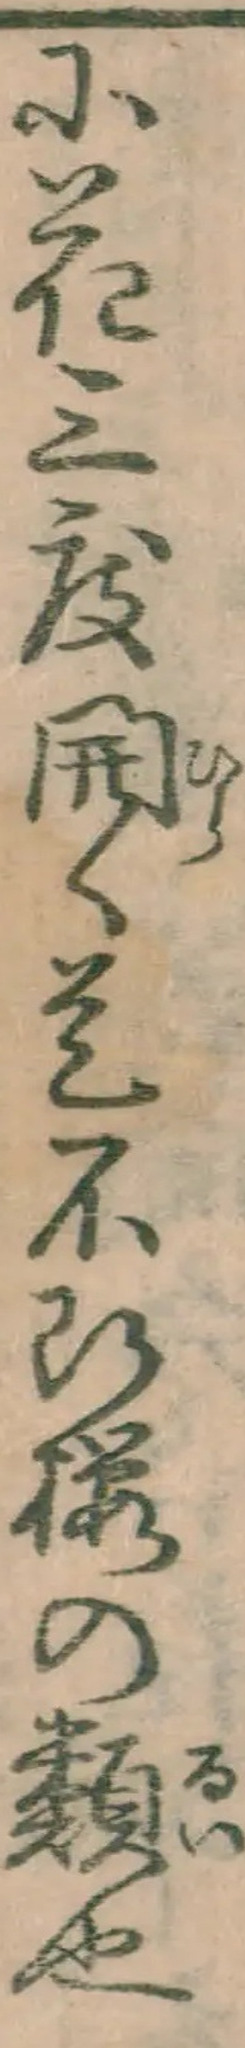に花三度開く是不断桜の類也
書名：怡顔齋櫻品
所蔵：国立国会図書館 National Diet Library, JAPAN
